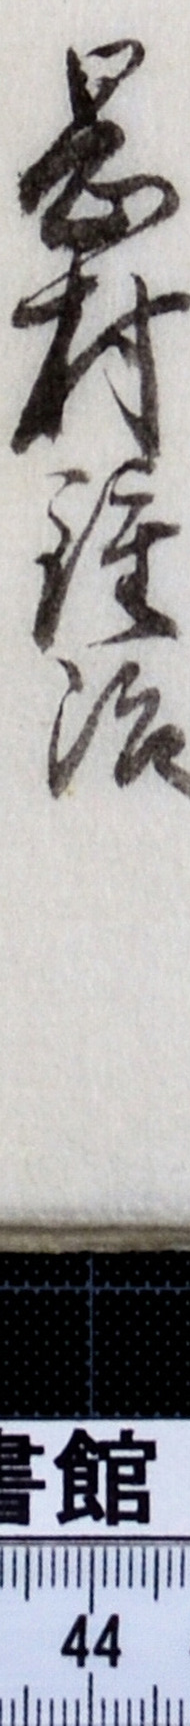岡村鍾治
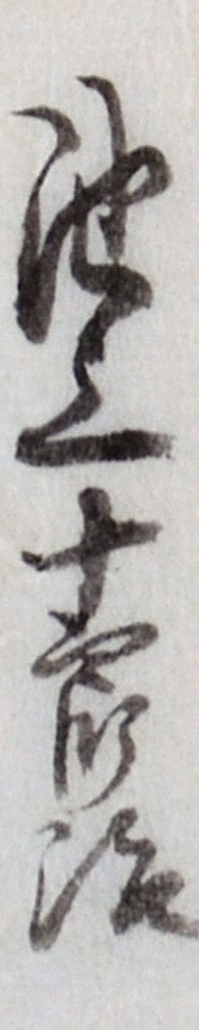池上十郎治
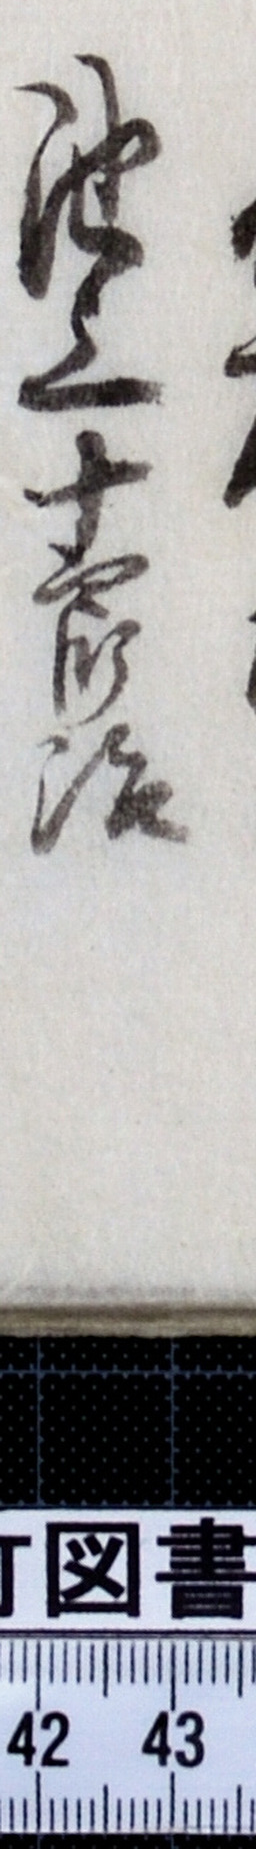池上十郎治
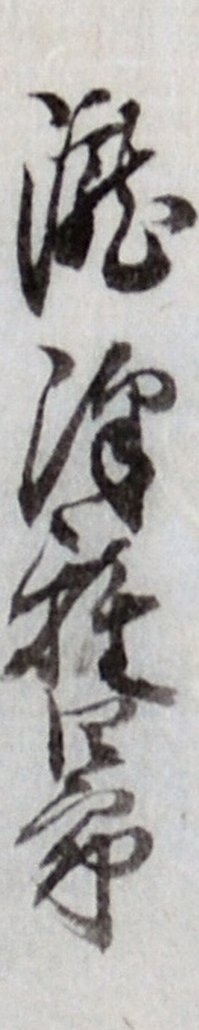滝沢雅四郎
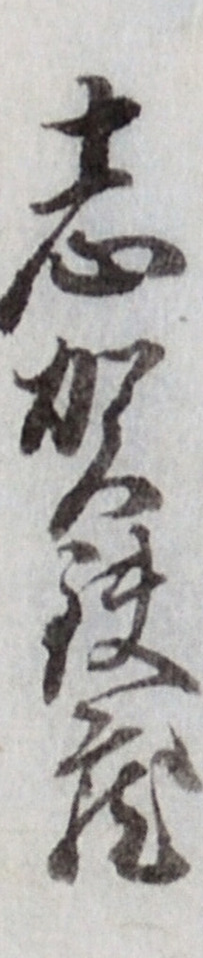志賀鉄蔵
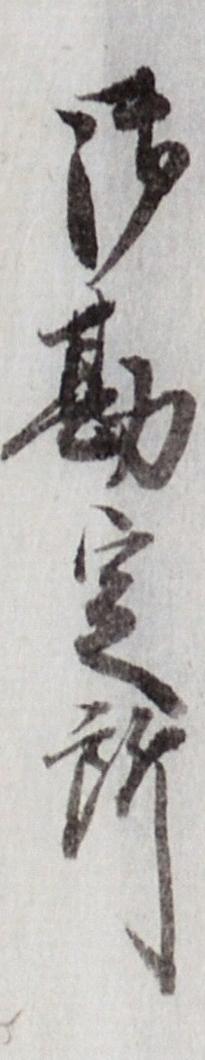御勘定所

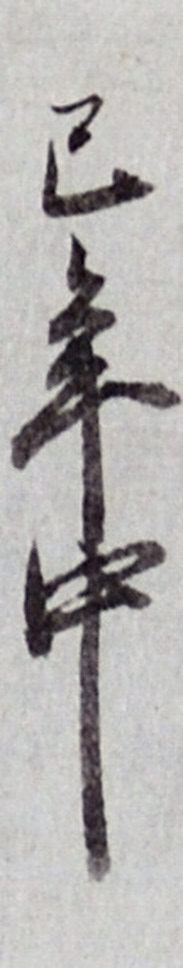巳年中
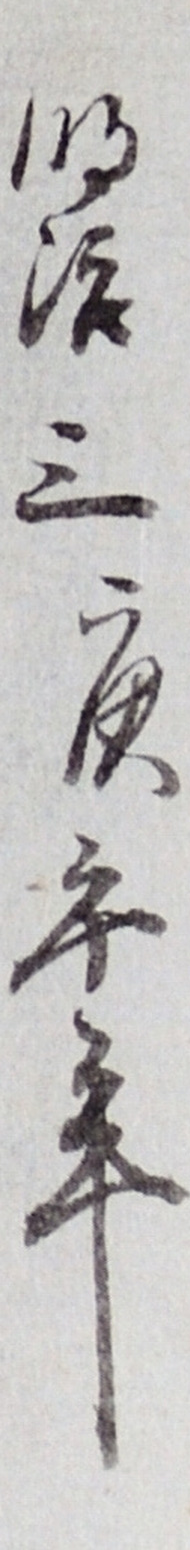明治三庚午年
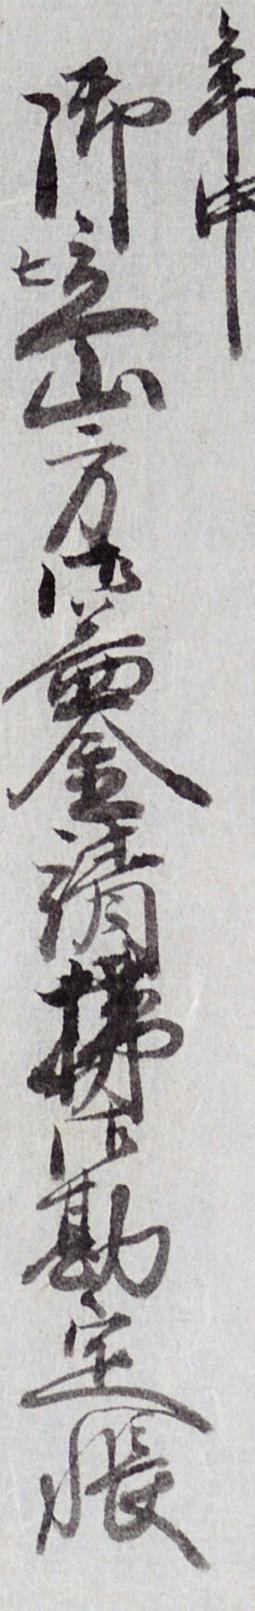御立山方御益金清払御勘定帳

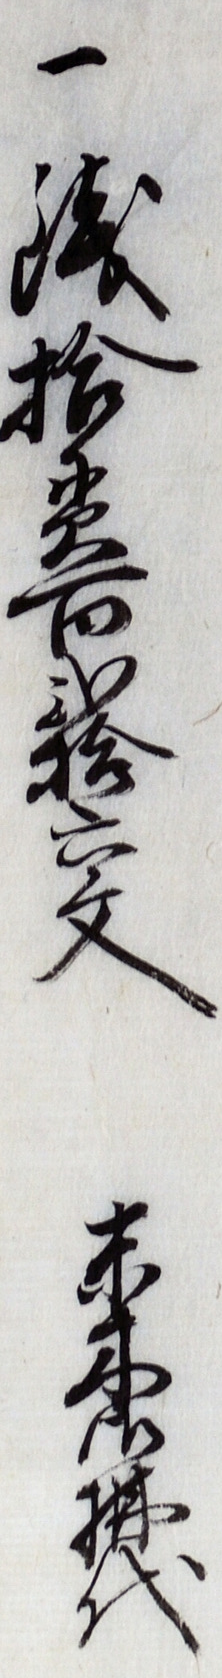一銭拾貫百弐拾六文末木御払代

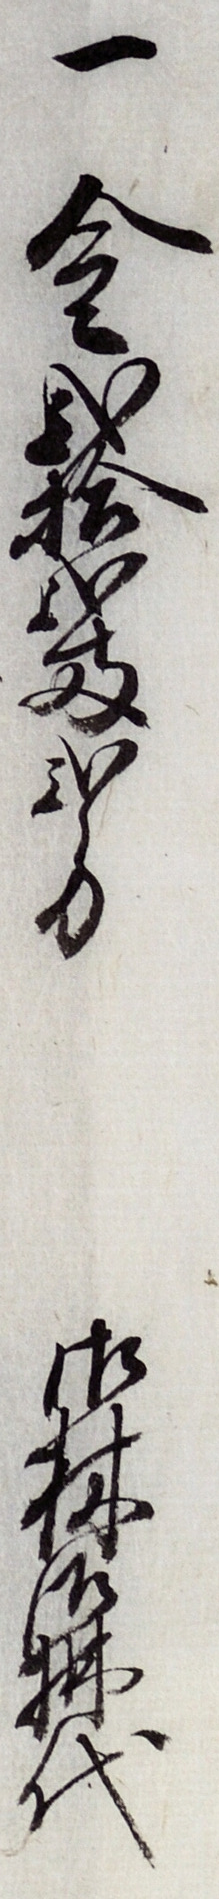一金弐拾弐両弐分御林御払代
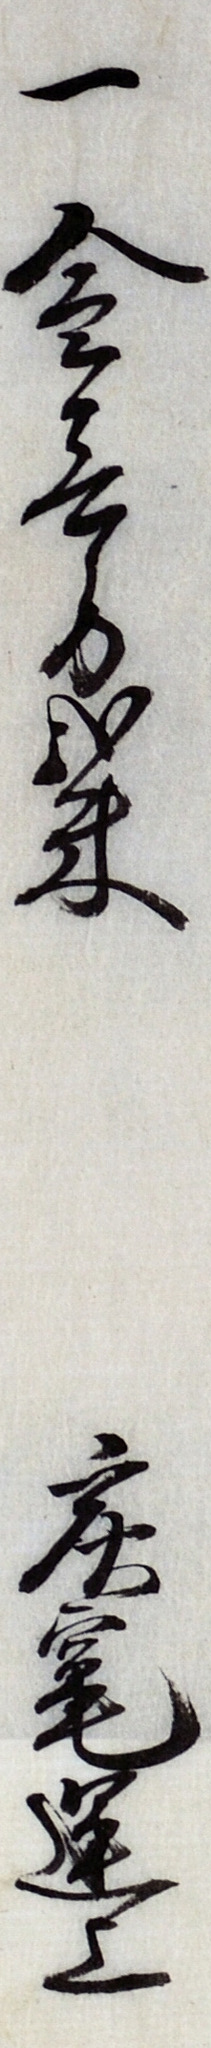一金壱分弐朱炭竈運上

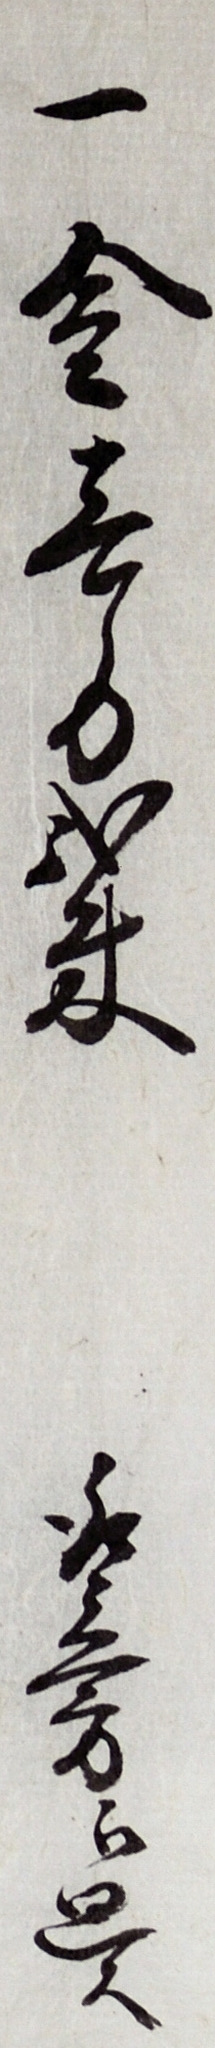一金壱分弐朱取立方え廻ス
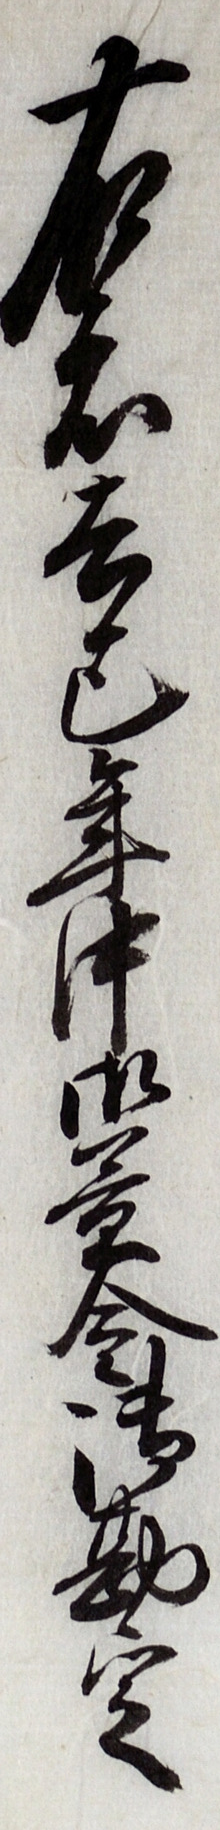右者去巳年中御益金御勘定
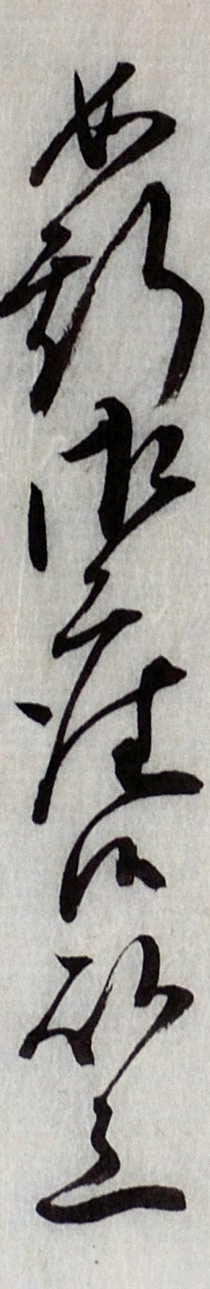如斯御座候以上
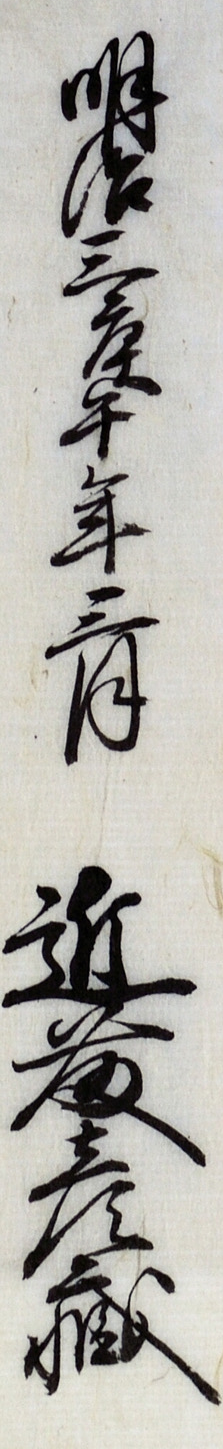明治三庚午年三月近藤彦蔵
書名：御山方御林方御藪方巳年中請払御勘定帳
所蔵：伊那市立高遠町図書館・合同会社AMANE
